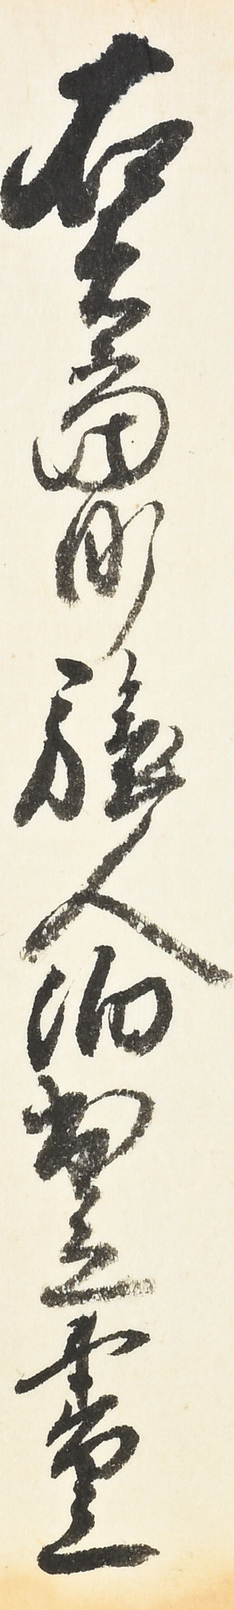右者当町旅人泊出立書上
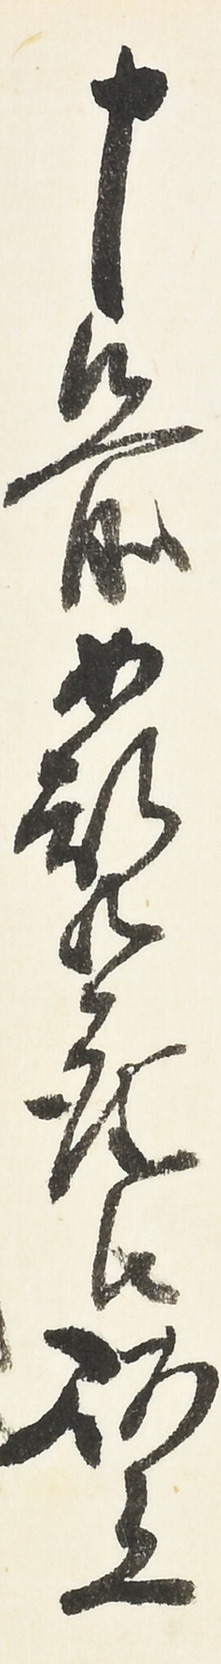申候所如斯御座候以上
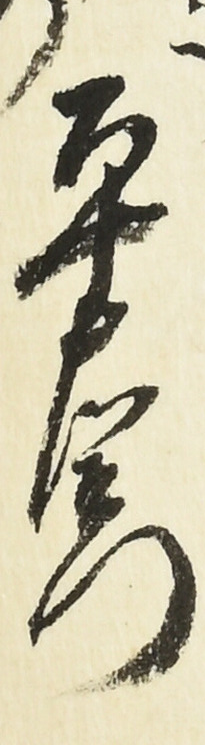平右衛門

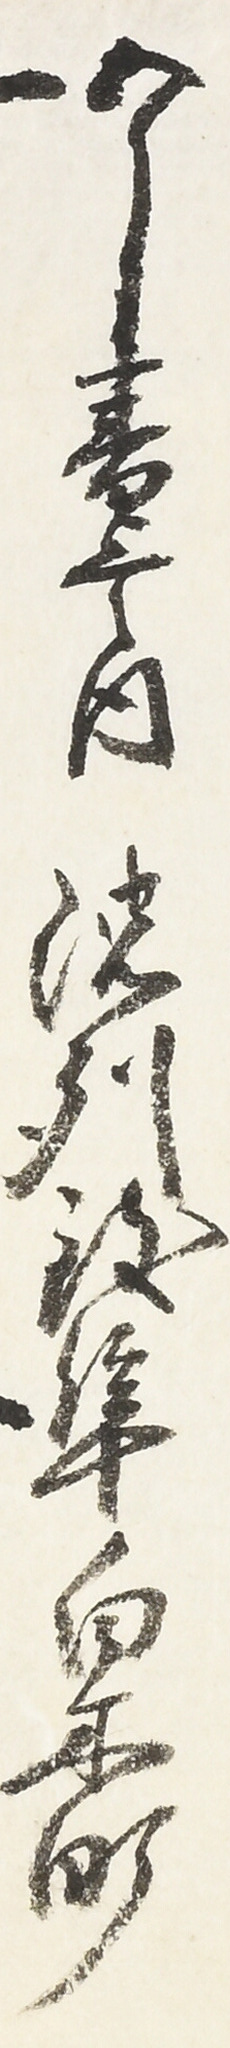五月書上之内濃州鈘隼白木町
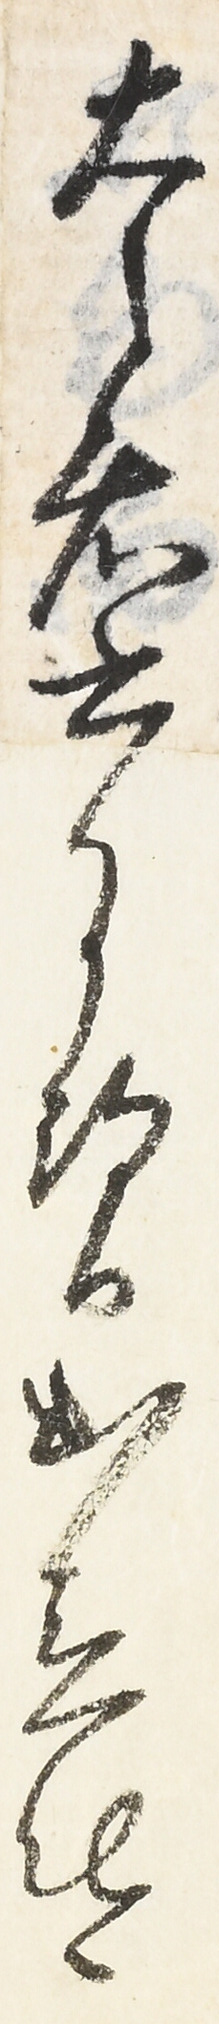右之者六月朔日出立仕候
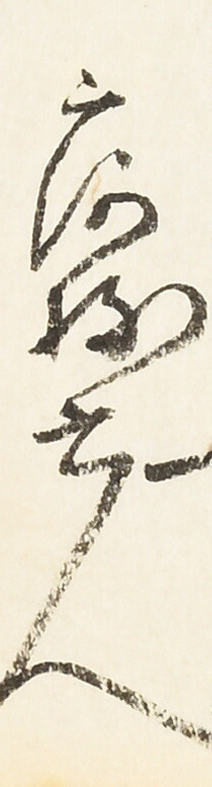荷持六人
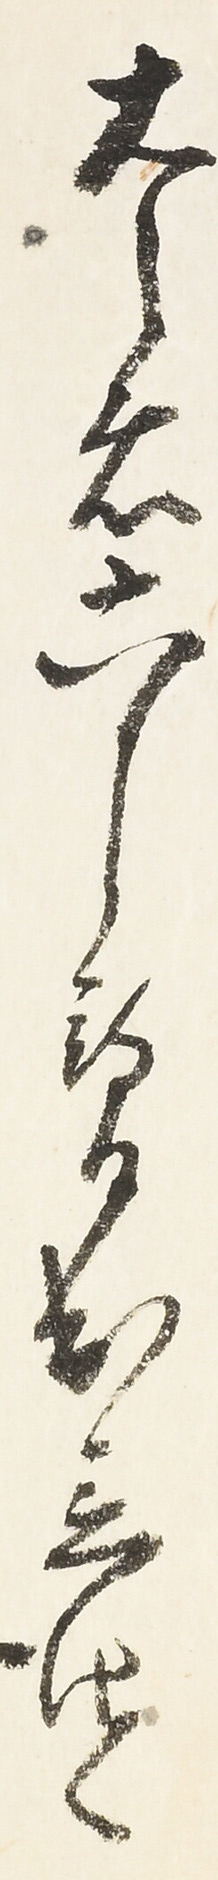右之者六月朔日出立仕候
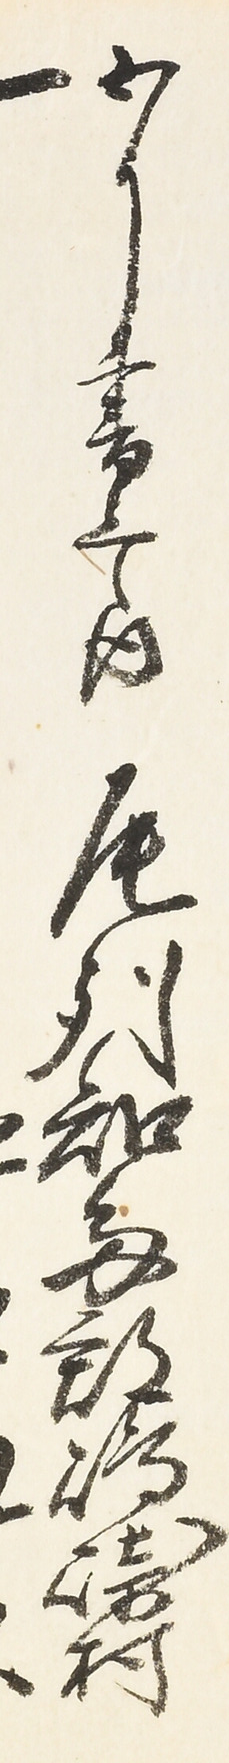五月書上之内尾州知多郡嶋崎村
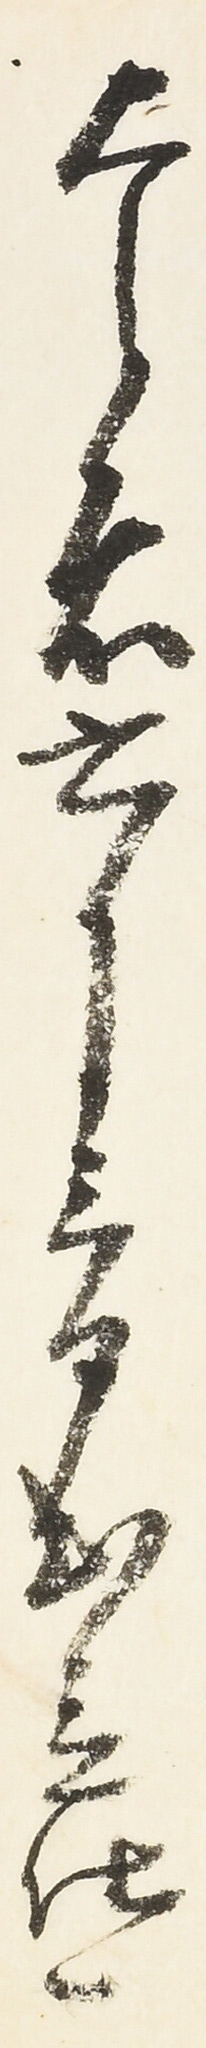右之者六月三日出立仕候
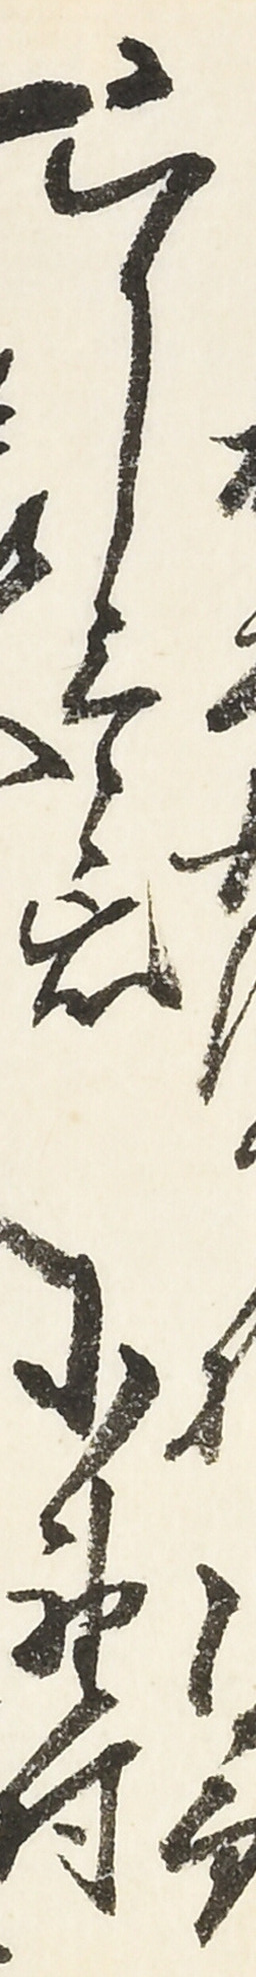六月三日着小野村
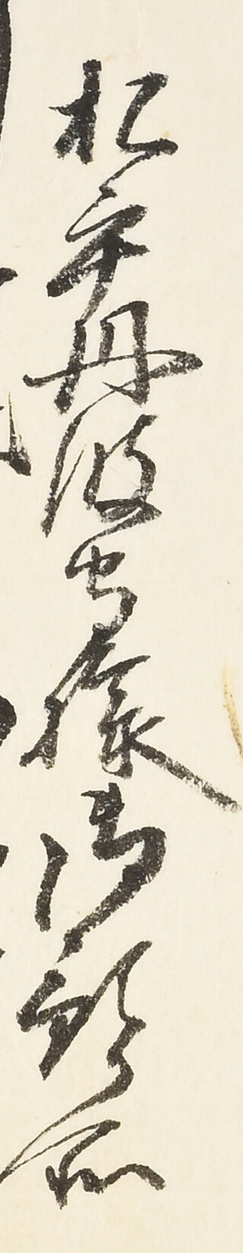松平丹波守様御預り所
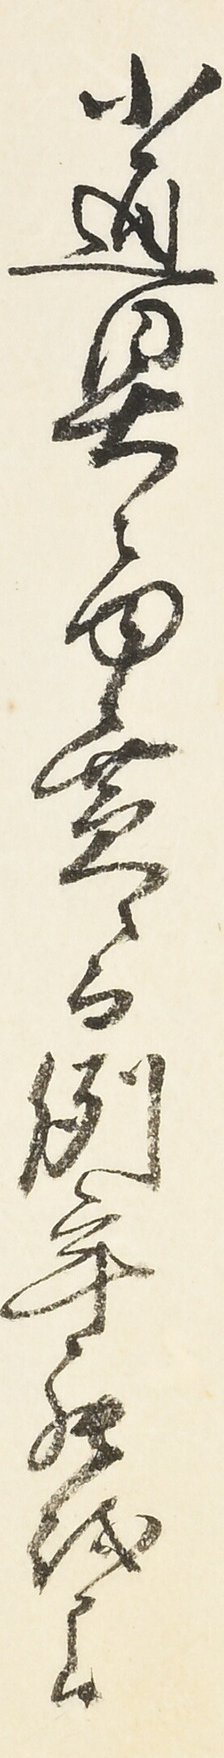小道具商売ニ而例年罷越申候
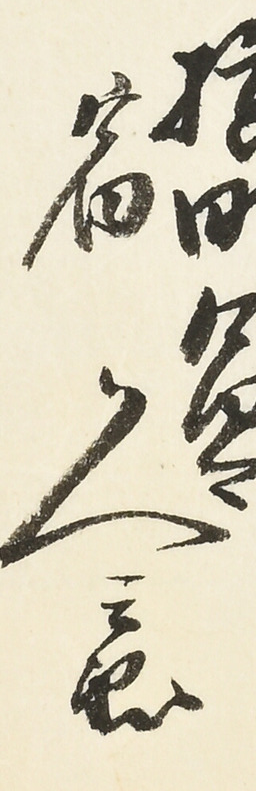宿久兵衛
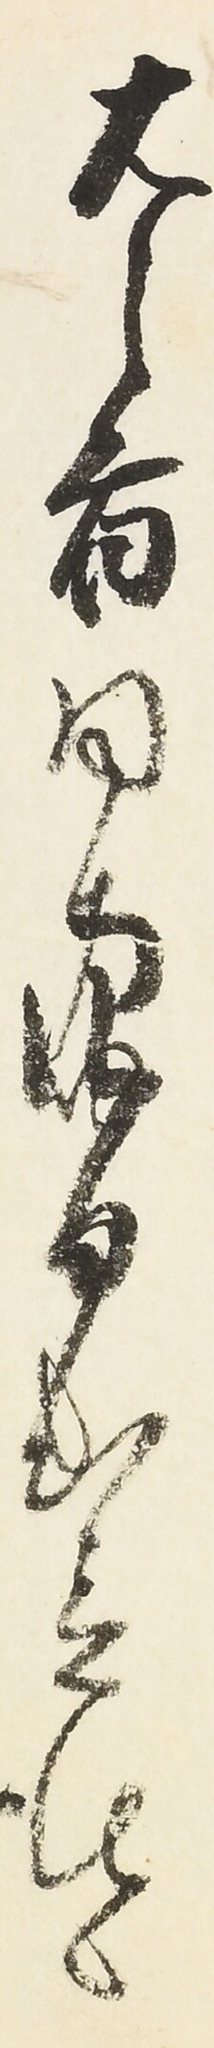右之者同四日出立仕候

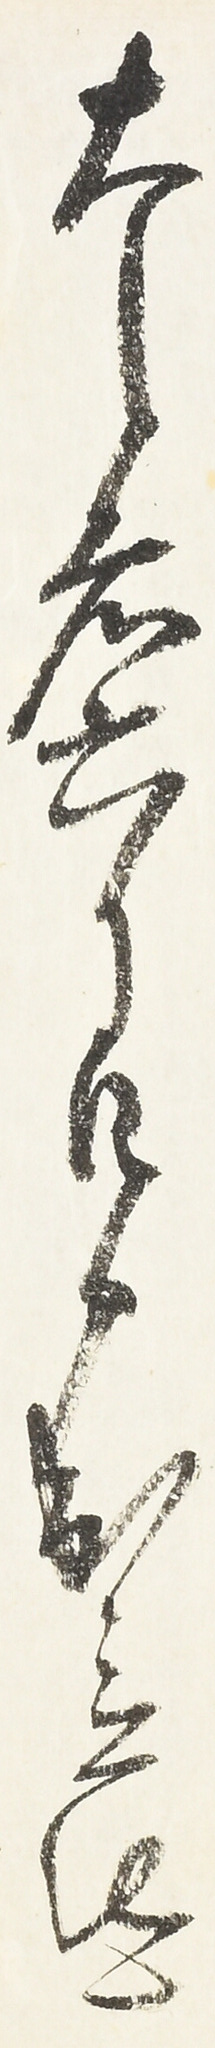右之者六月四日出立仕候
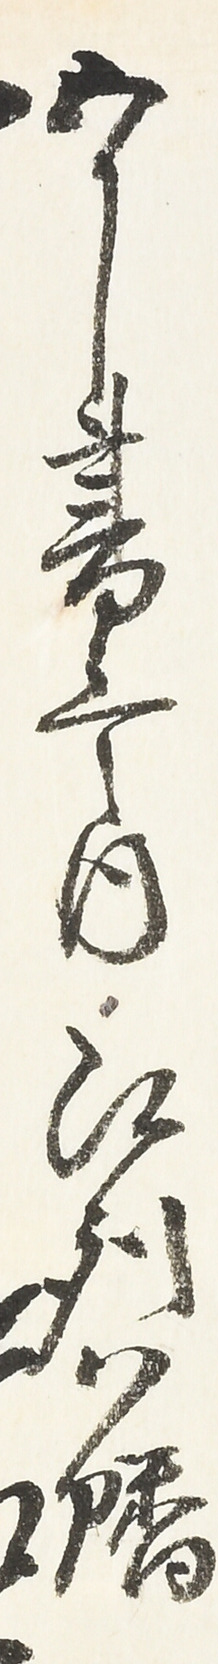五月書上之内江州日野
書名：町中旅人泊控帳
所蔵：伊那市立高遠町図書館・合同会社AMANE
